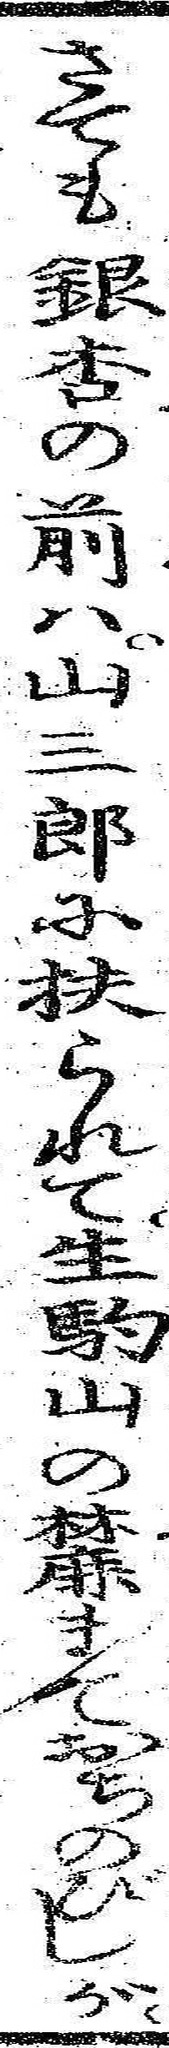さても銀杏の前は。山三郎に扶られて。生駒山の麓までおちのびしが。
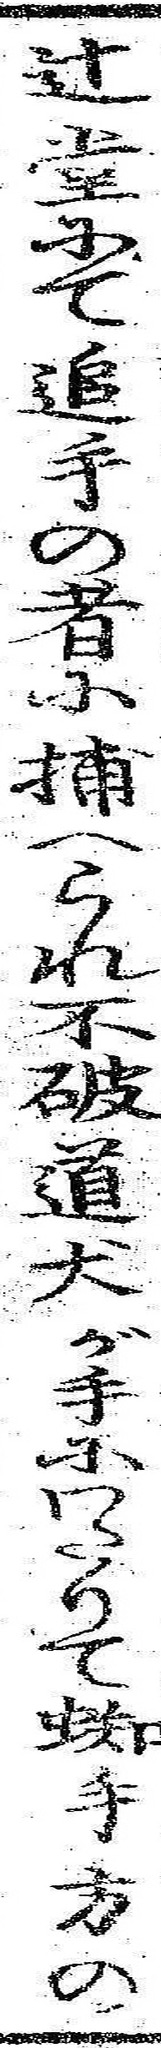辻堂にて追手の者に捕へられ。不破道犬が手にわたりて。蜘手方の
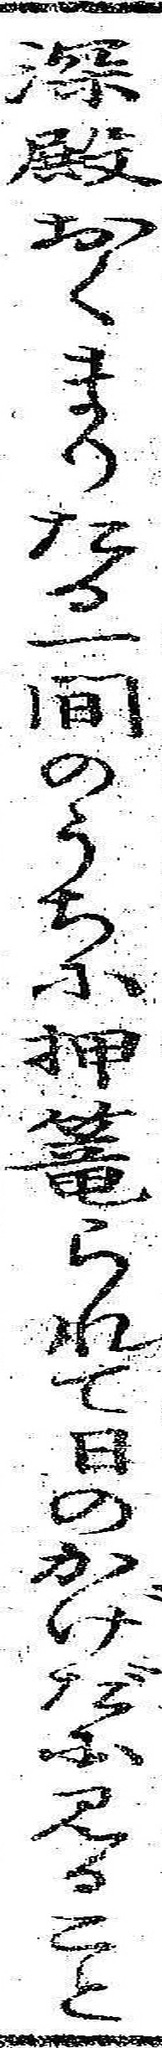深殿。おくまりたる一間のうちに押篭られて。日のかげだに見ること
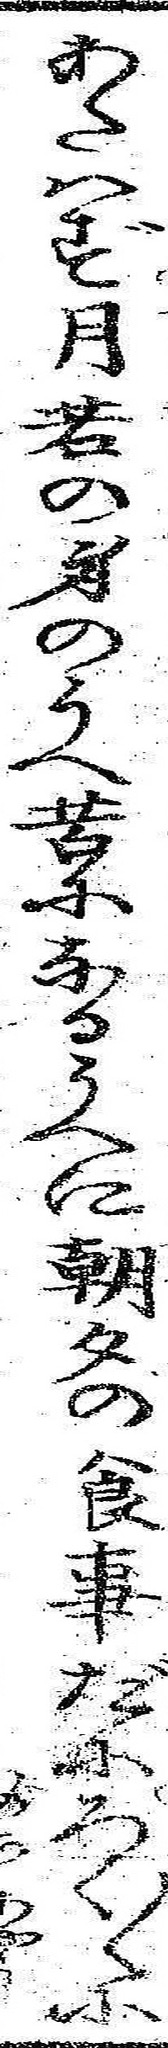あたはず。月若の身のうへ苦になるうへに。朝夕の食事だに。ろく〳〵に
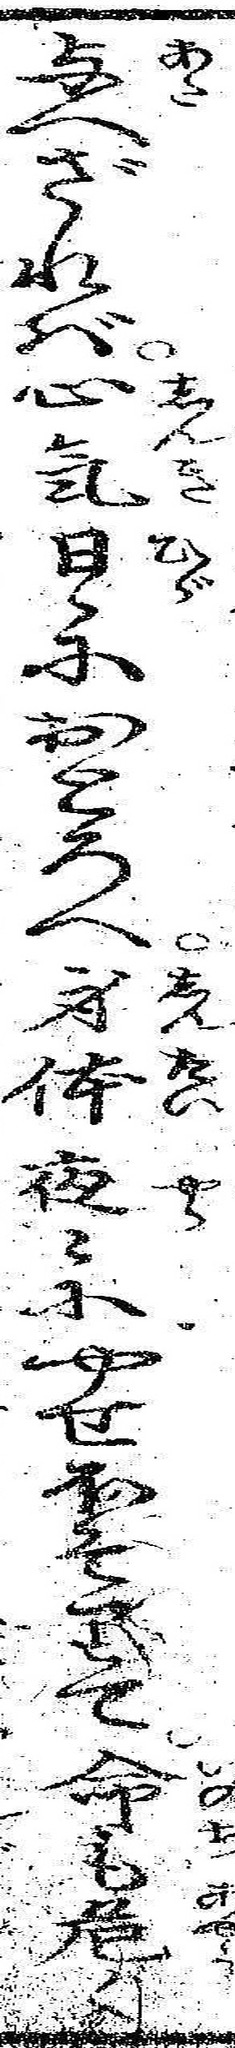与へざれば。心気日々におとろへ。身体夜々にやせほそりて。命も危く
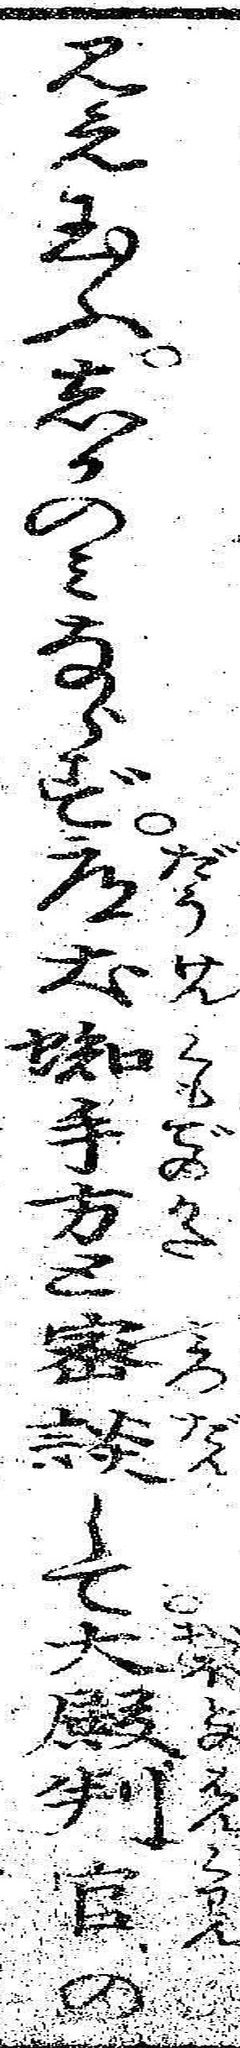見え玉ふ。しかのみならず。道犬蜘手方と密談して。大殿判官の
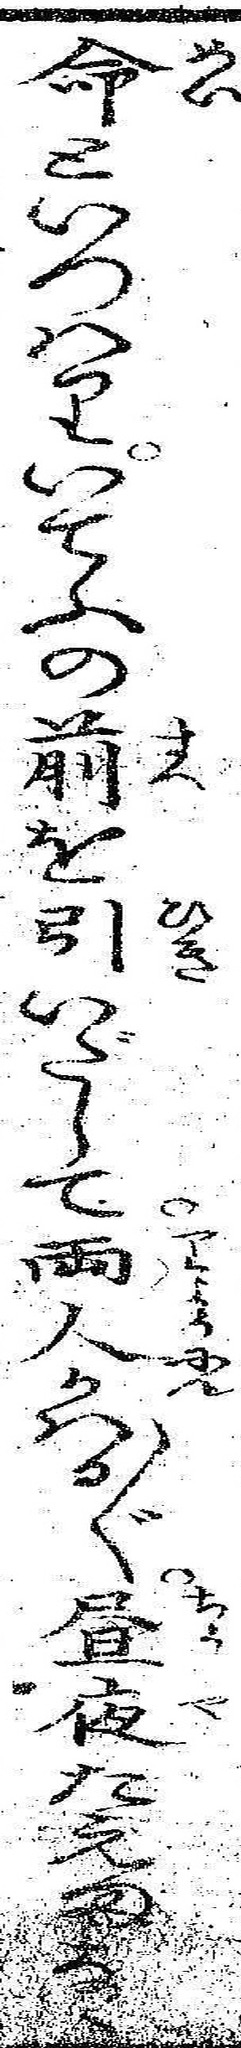命といつはり。いてふの前を引いだして。両人かはる〴〵。昼夜たえまなく
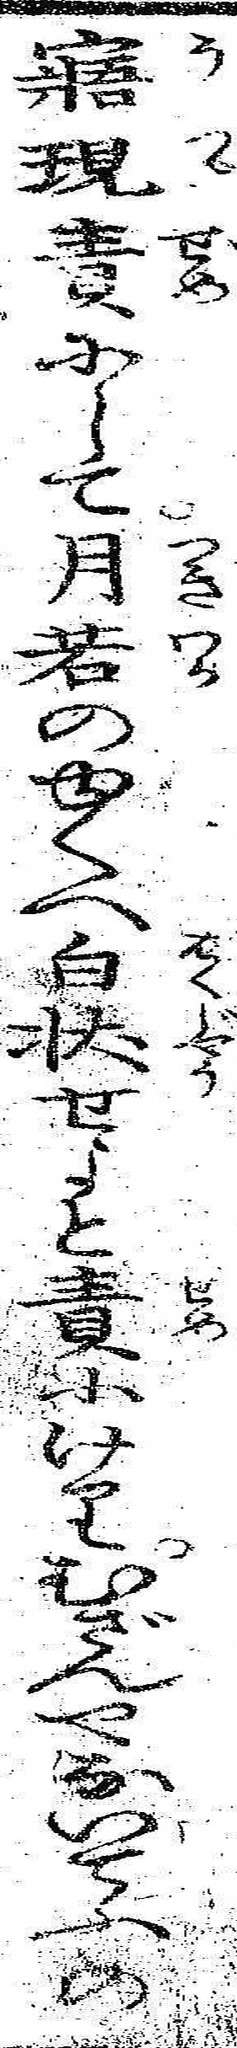寤現責にして。月若のゆくへ白状せよと責にけり。むざんやないてふの

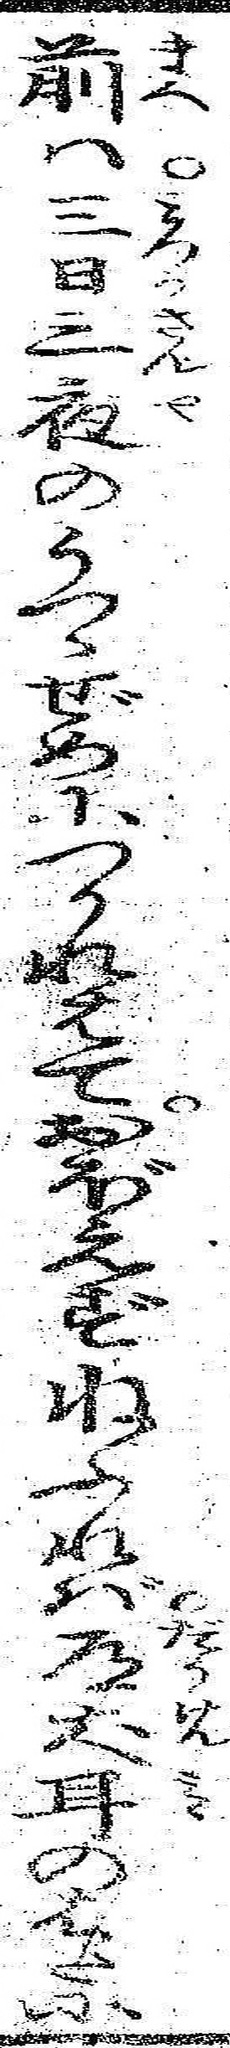前は。三日三夜のうつゝぜめにつかれはて。おぼえずねふれば。道犬耳のはたに
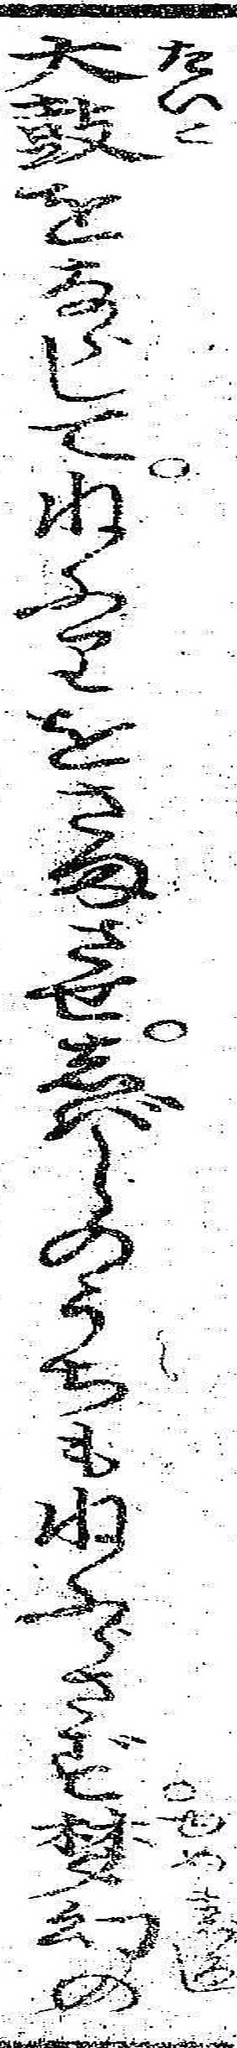大鼓をならして。ねふりをさまさせ。しばしのうちもねふらさず。夢幻の
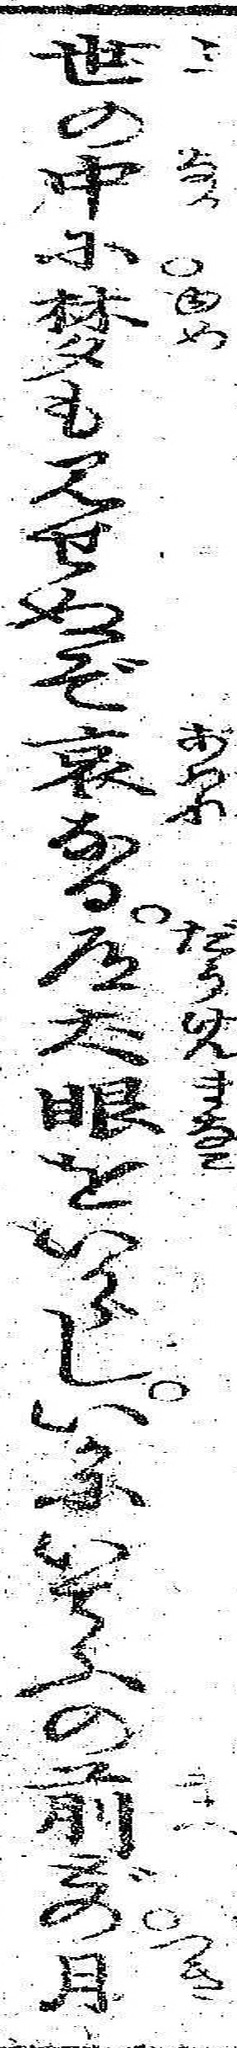世の中に。夢も見せぬぞ哀なる。道犬眼をいからし。いかにいてふの前どの。月
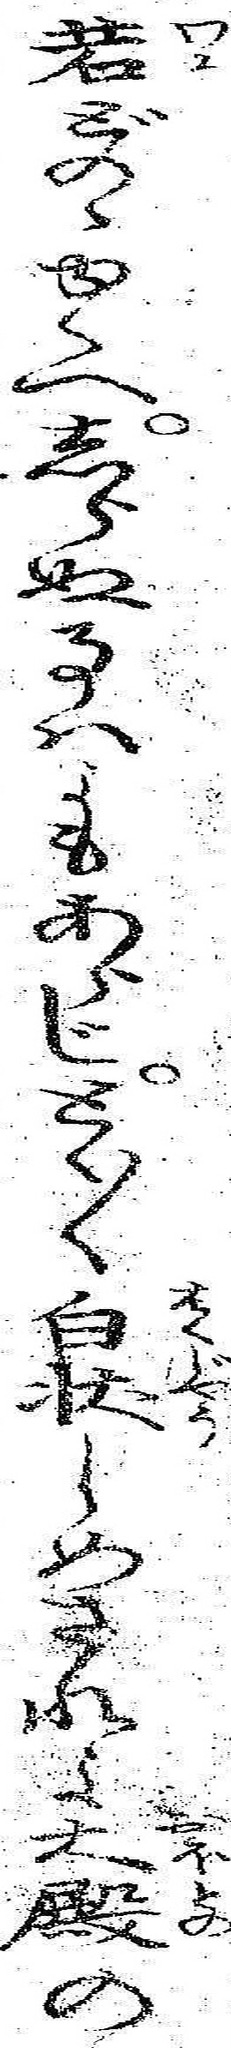若どのゝゆくへ。しらぬ事はよもあらじ。とく〳〵白状しめされよ大殿の
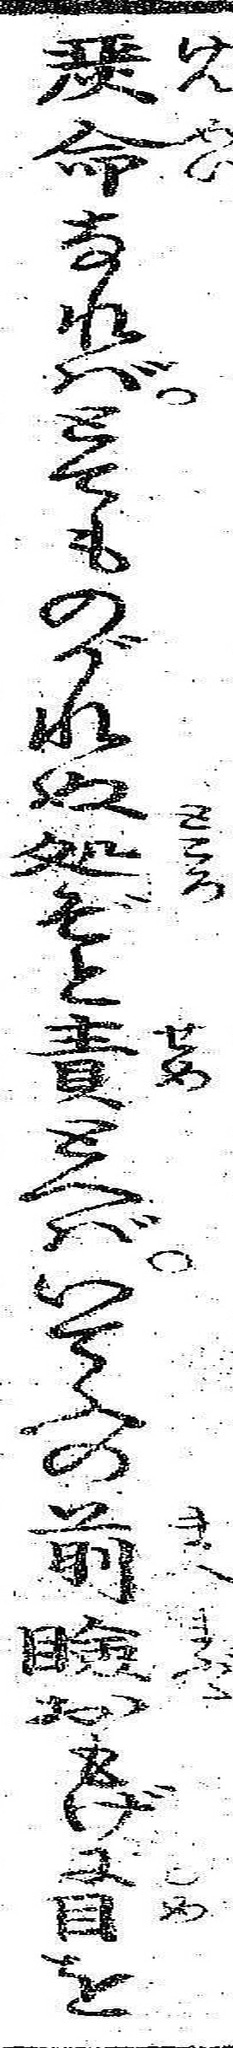厳命なれば。とてものがれぬ処ぞと責とへば。いてふの前瞼おもげに。目を
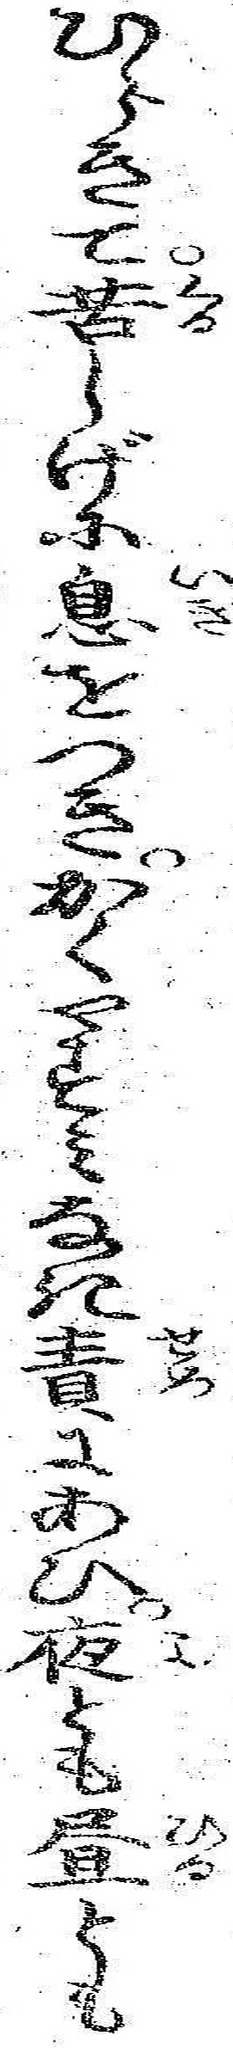ひらきて。苦しげに息をつき。かくやすみなき責にあひ。夜とも昼とも
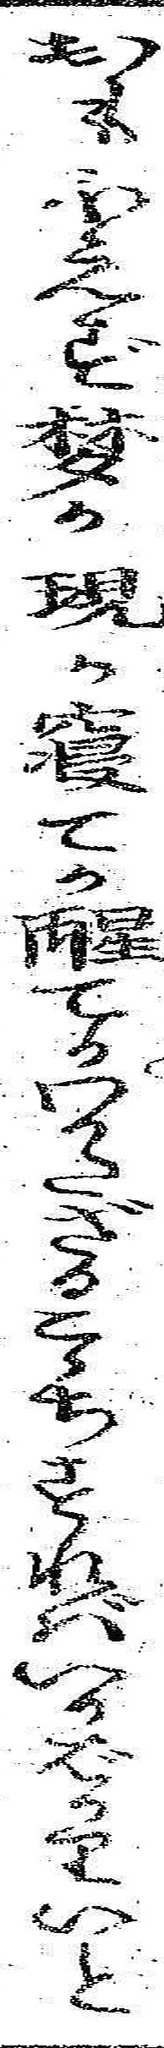おもほえず。夢か現か寝てか醒てか。わかたざるこゝちすればいかばかりいと
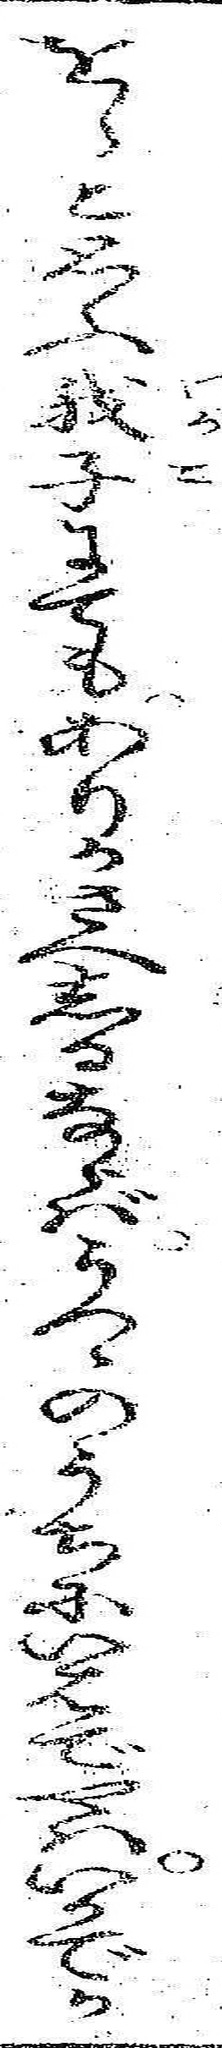をしと思ふ我子にても。。ありかさへしるならば。うつゝのうちにいはでやは。いかでか
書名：昔話稲妻表紙
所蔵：国文学研究資料館
